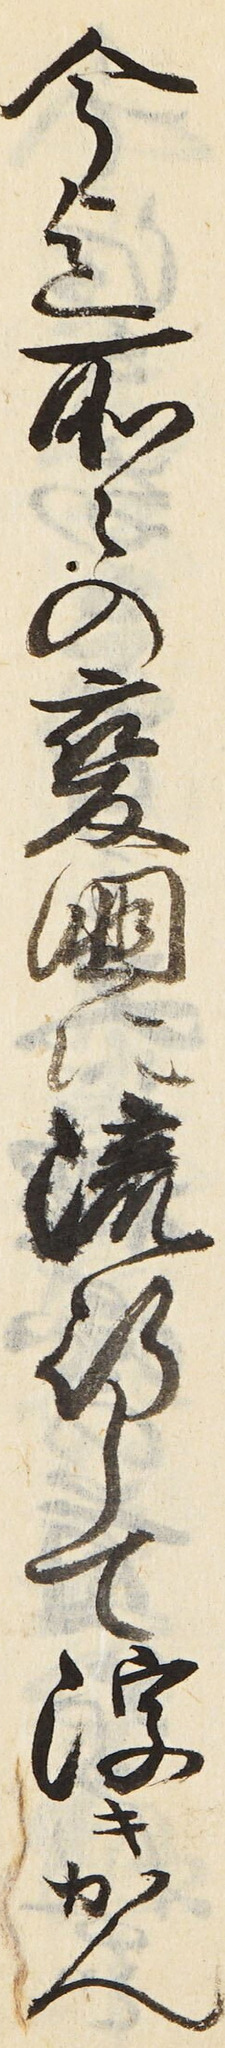今迠所々の変国に流行して浮きかん
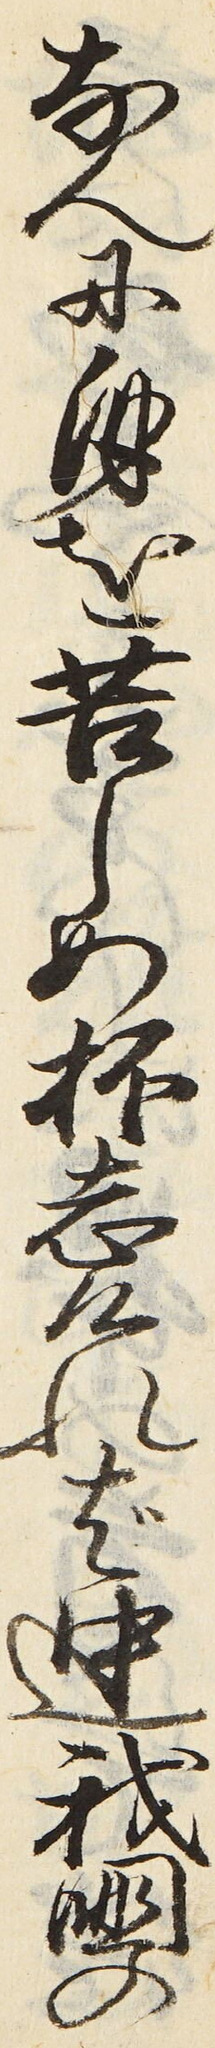なんに身を苦しめ抔しければ迚我国の
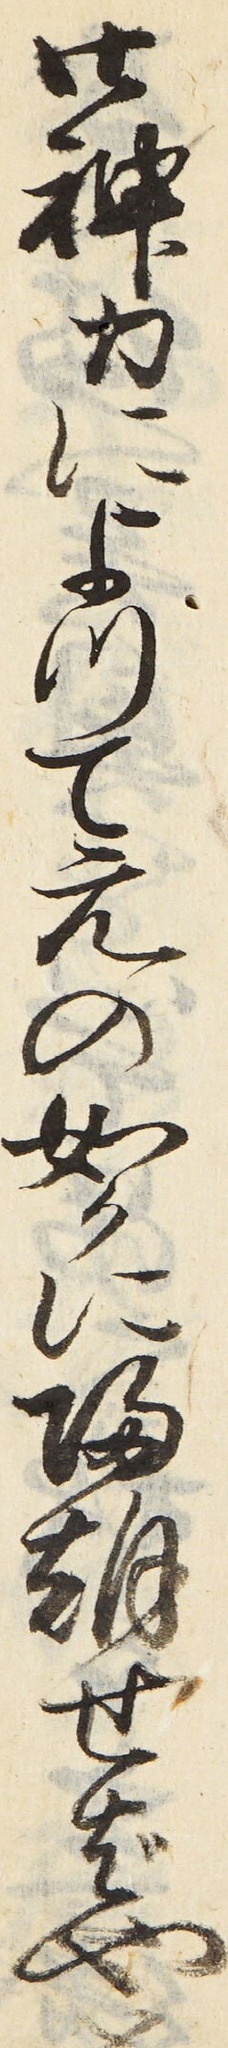御神力によつて元の如くに帰朝せばやと
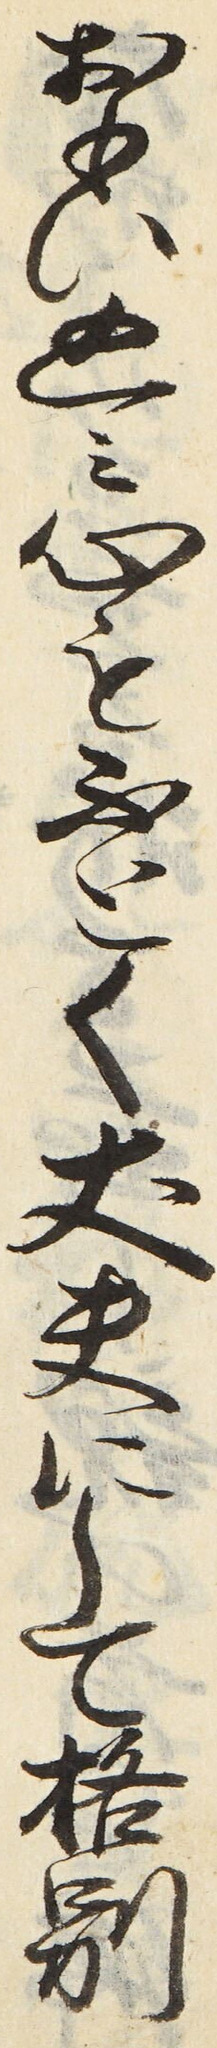おもひ込み心もふとく丈夫にして格別
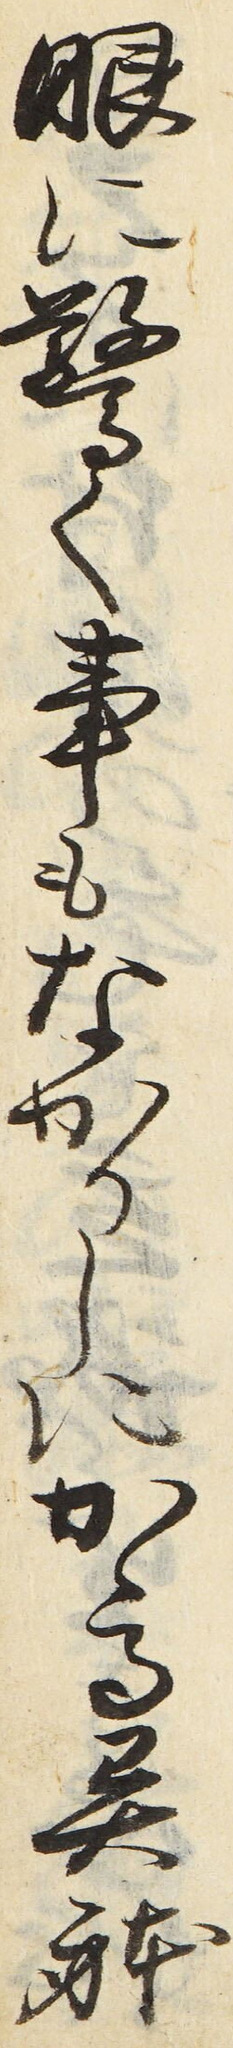眼に驚く事もなかりしにかゝる異躰

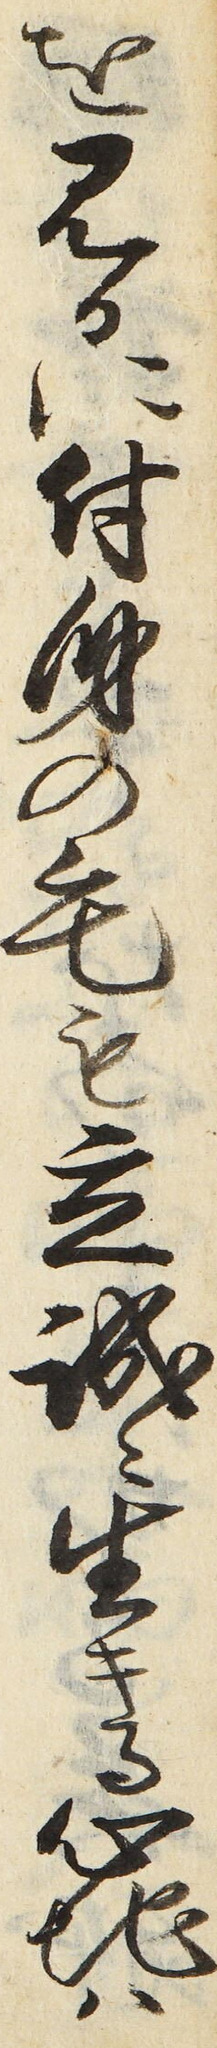を見るに付身の毛も立誠に生きる心地は
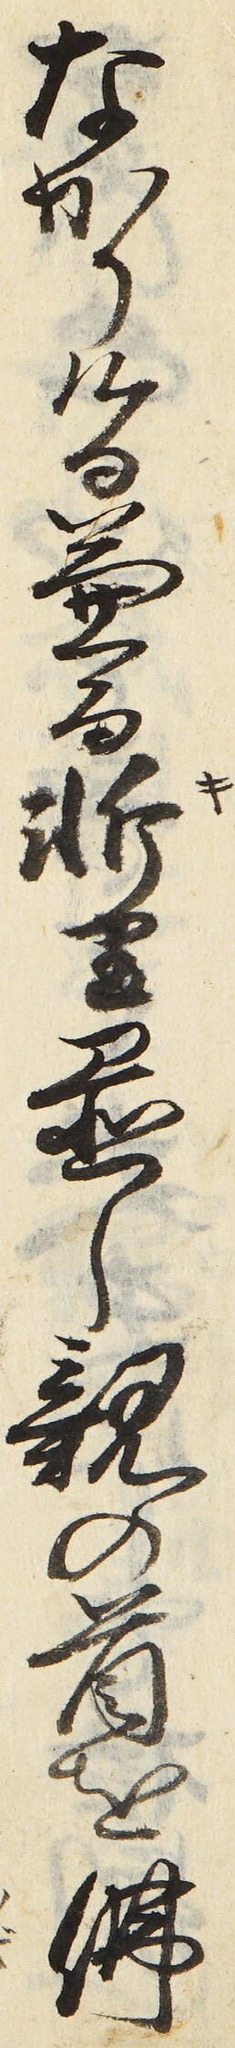なかりける兼而斬り置し親の首を仏
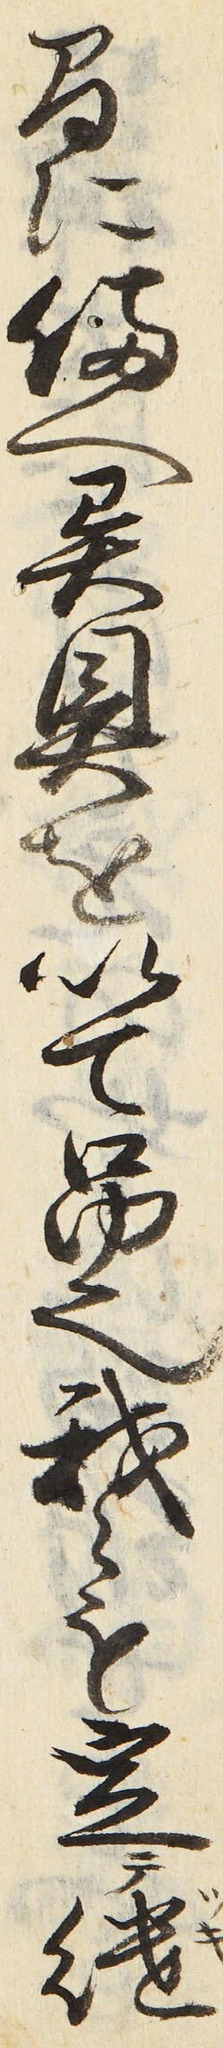間に備へ異具を以て吊也我々も定て継
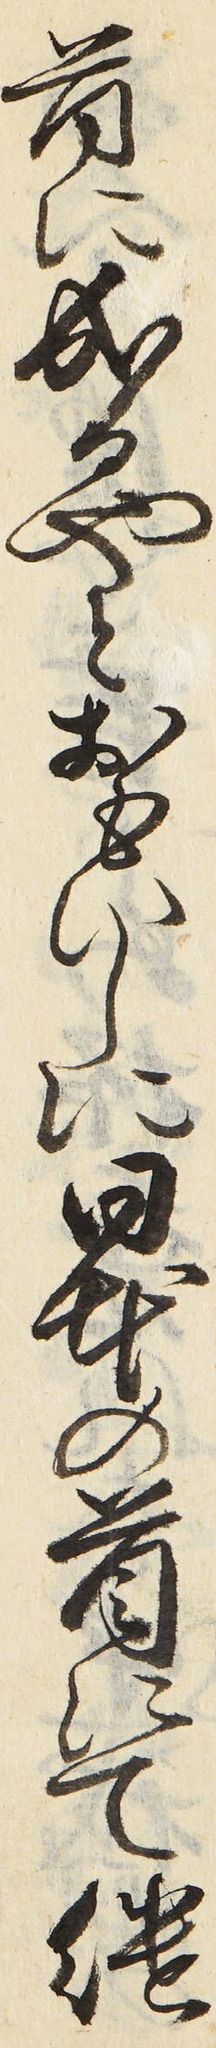首に成るやとおもひしに日本の首にて継
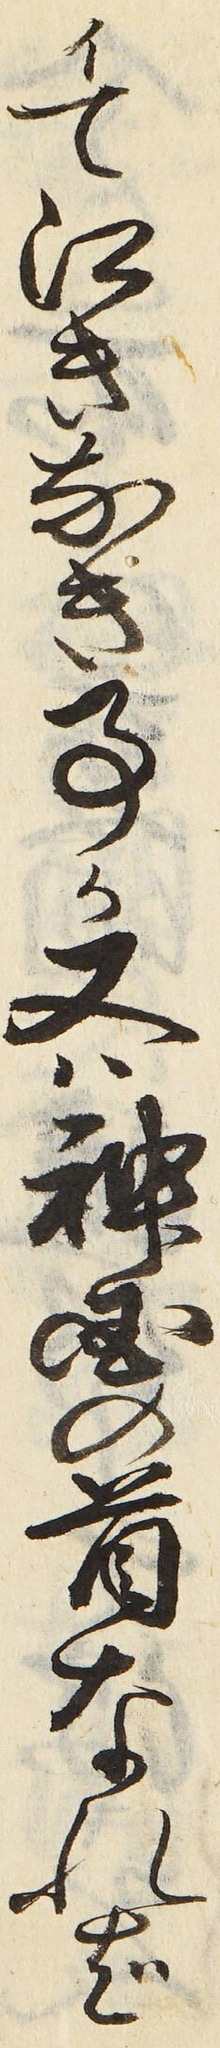いてえきなき事か又は神国の首なれば
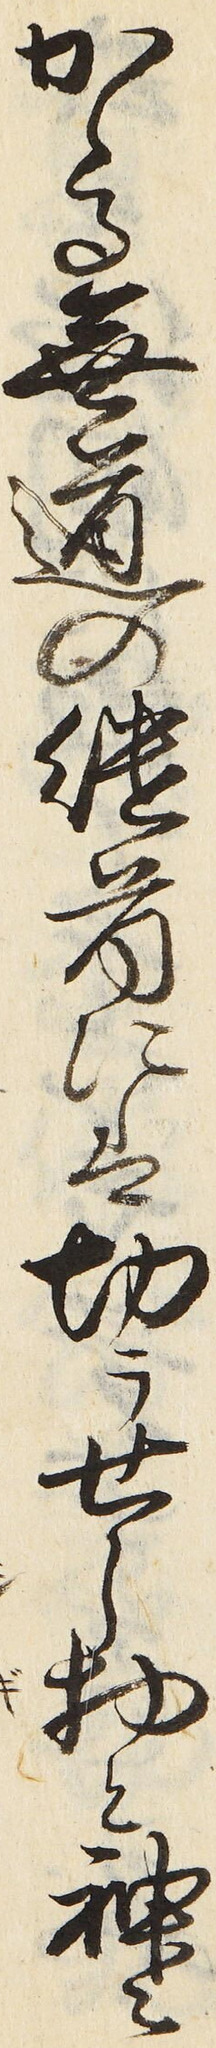かゝる無道の継首には切らせし物と神々
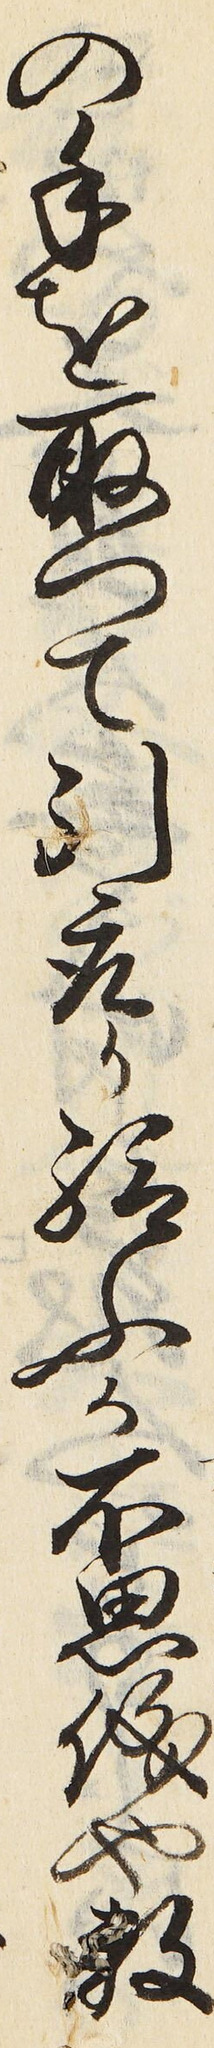の手を取つて引取り給ふか不思議や数
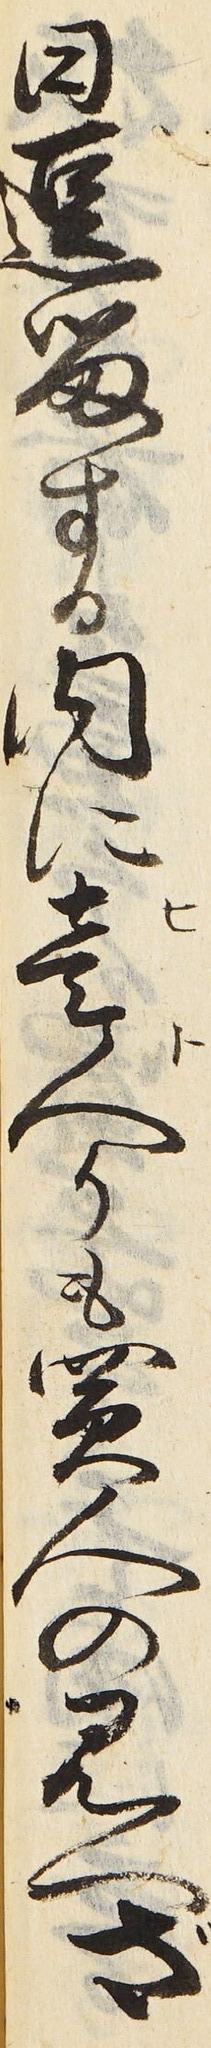日逗留する内に壱人りも買人の見へざ
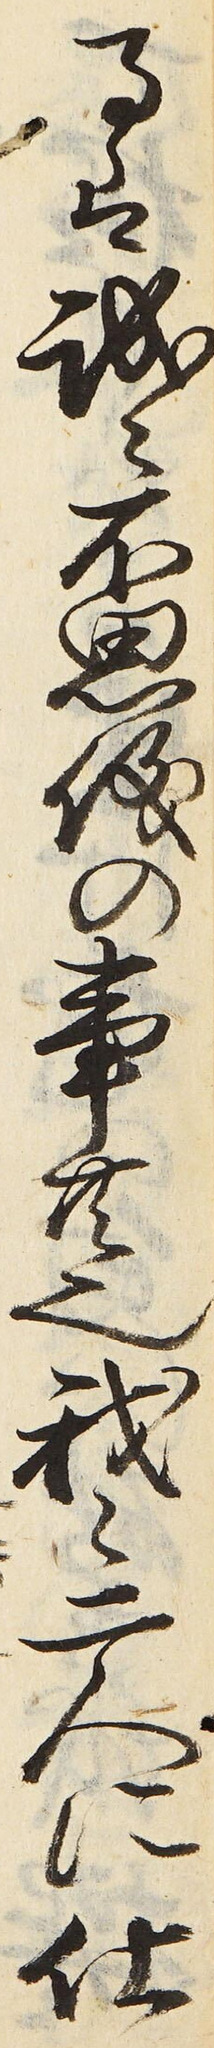るは誠に不思議の事共也我々二人に仕
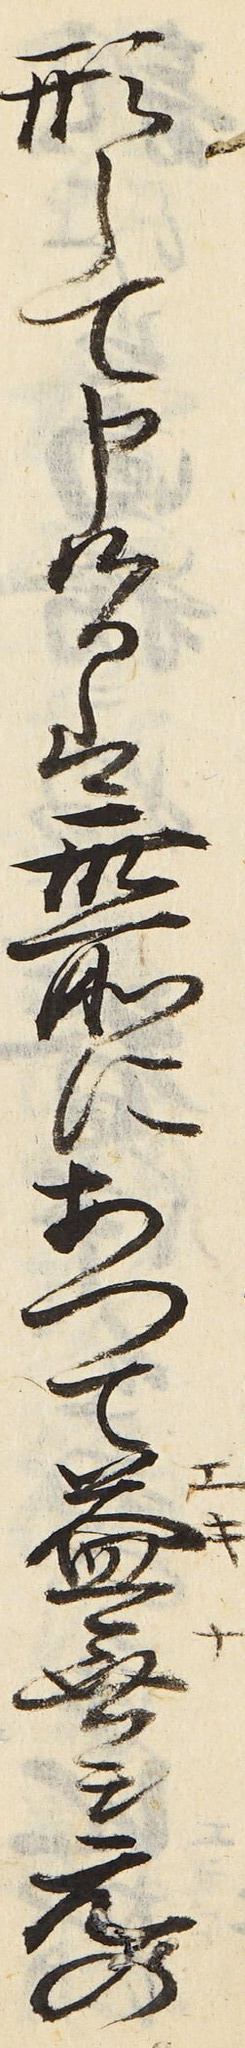形して申けるは此所にあつて益無し元の
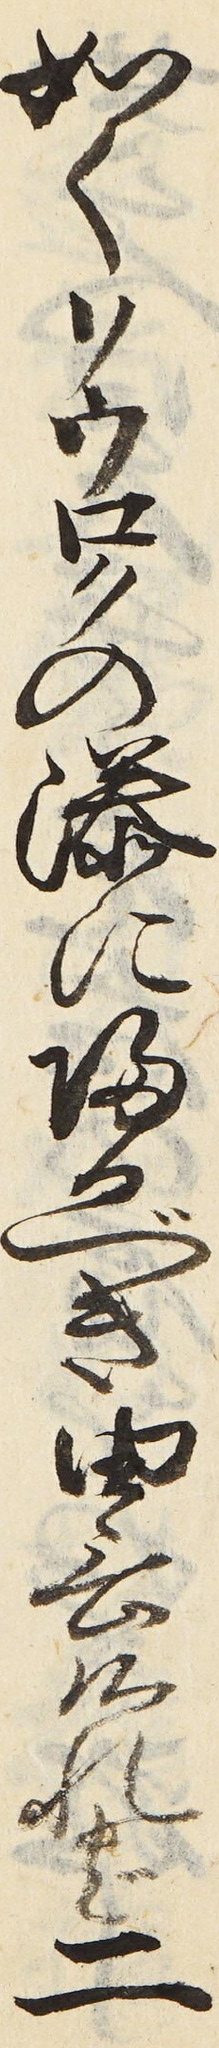如くソウロクの湊に帰るべき由云ければニ
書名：華夷九年録
